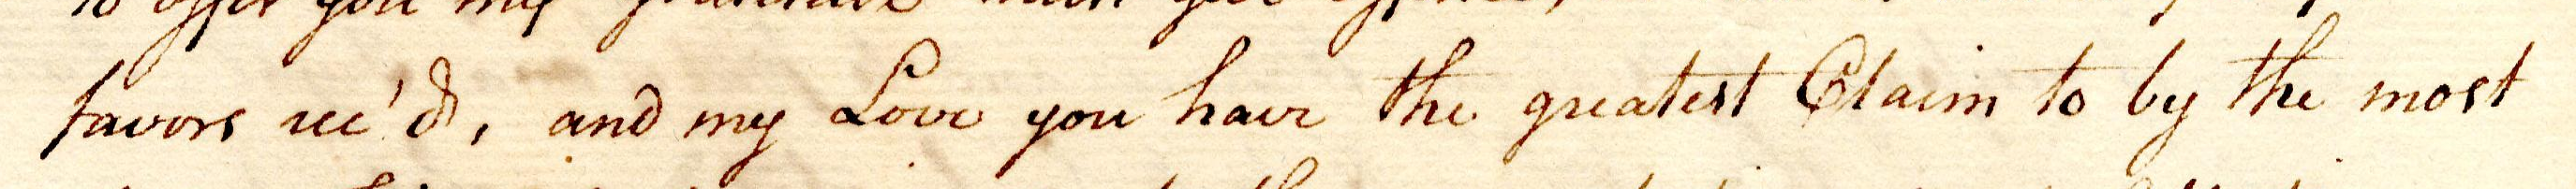favors rec'd, and my Love you have the greatest Claim to by the most
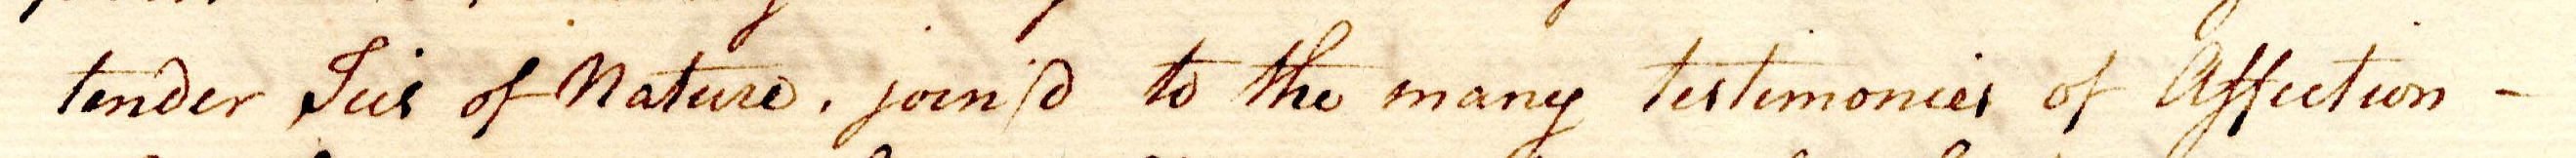tender Tuis of Nature, join'd to the many testimonies of Affection.
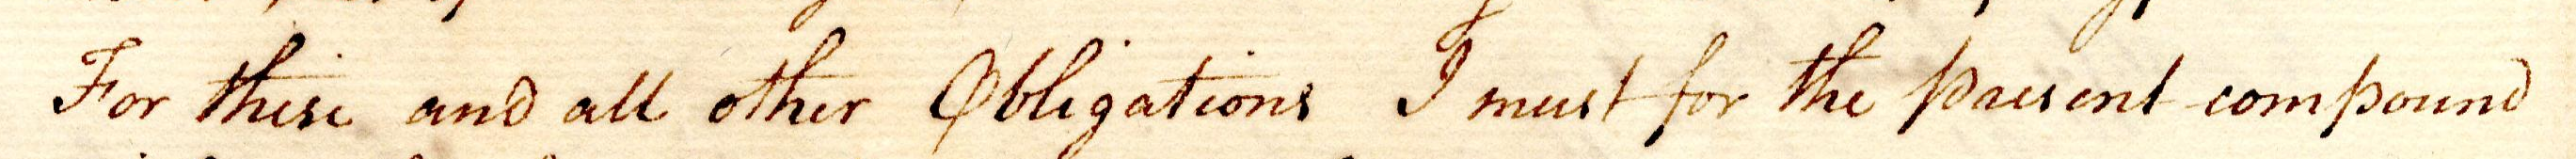For thise and all other Obligations I must for the present compound
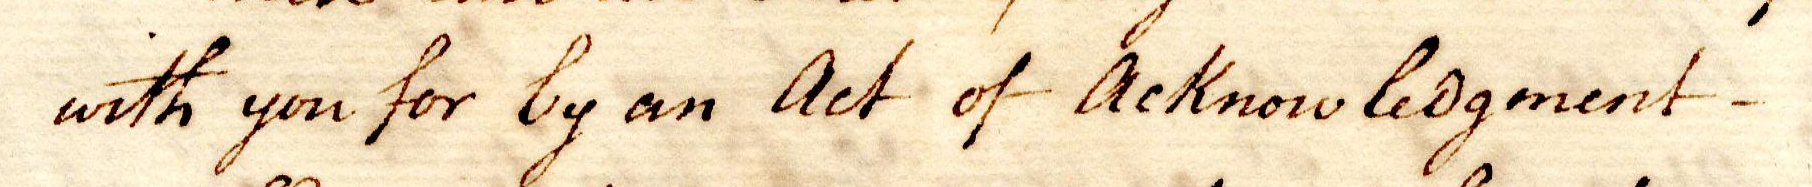with you for by an Act of Acknowledgment.
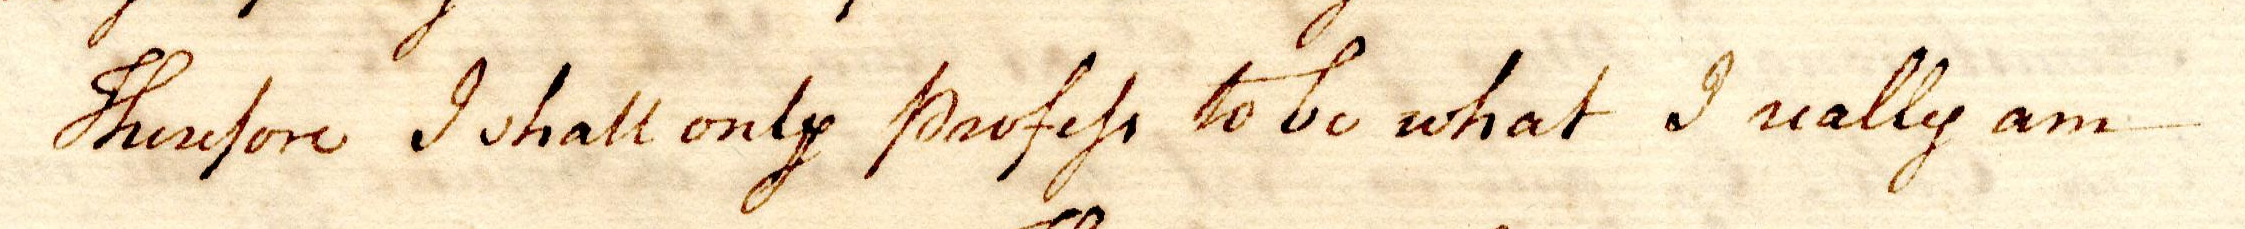Therefore I shall only profess to be what I really am
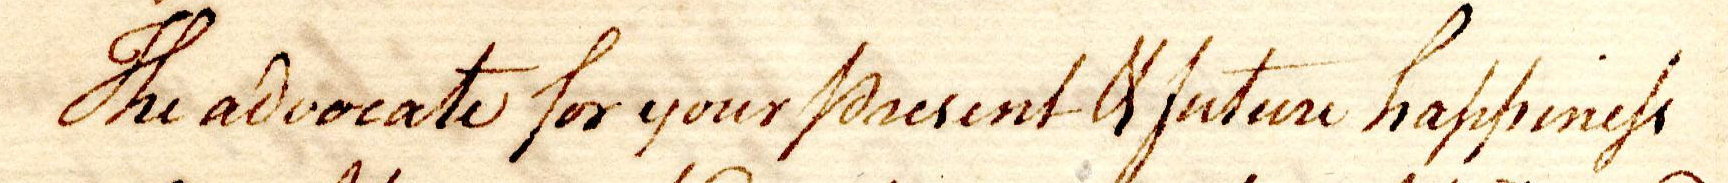The advocate for your present & future happiness
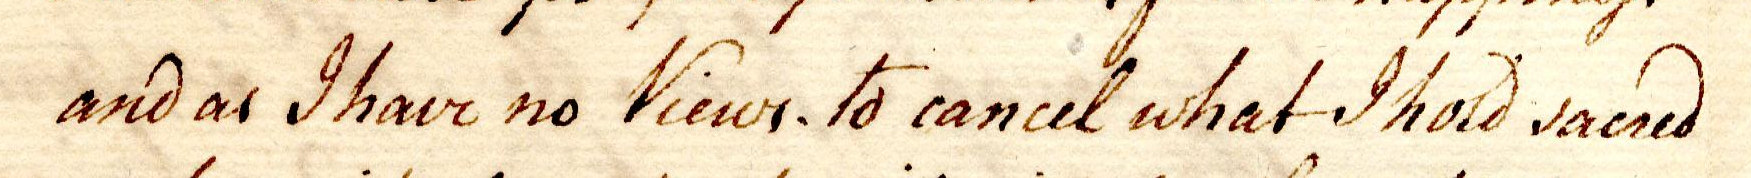and as I have no Views to cancel what I hold sacred
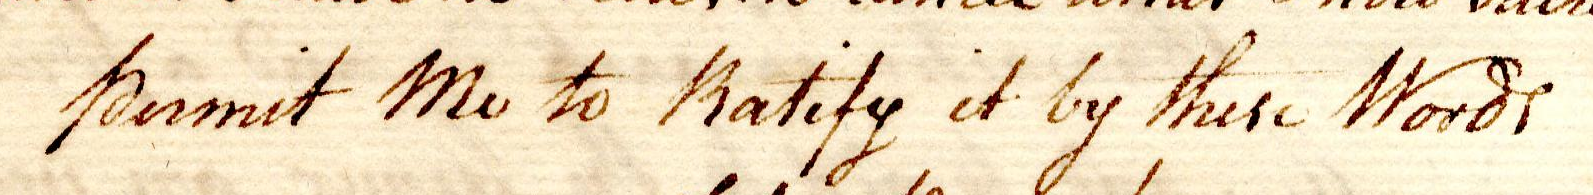permit Me to Ratify it by these Words
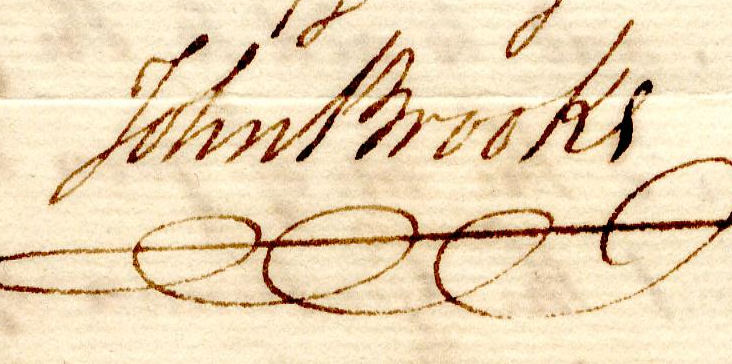John Brooks
